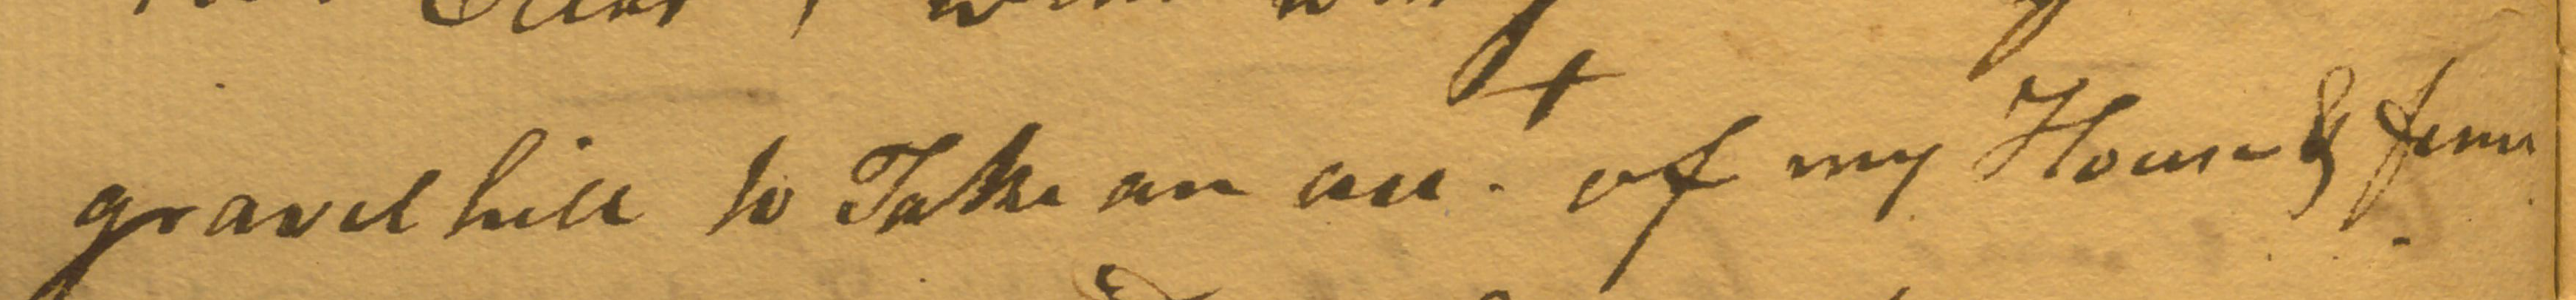gravel hill to Take an acc^t. of my House & fence
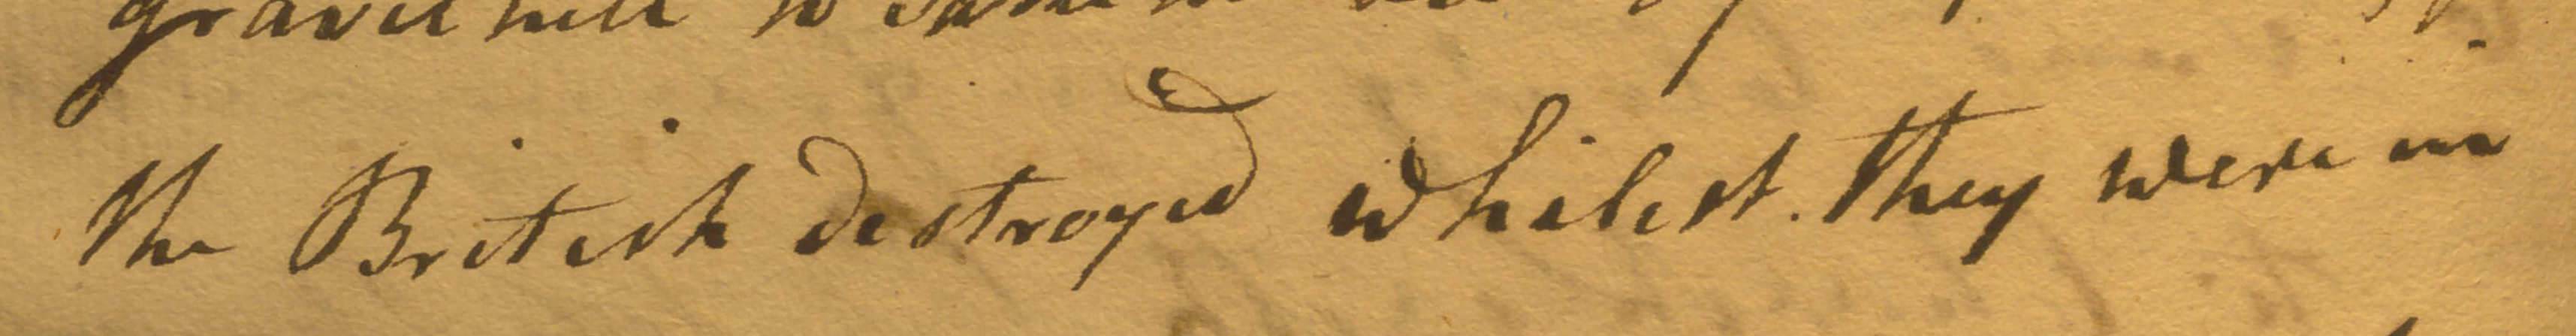the British destroyed whilest they were in
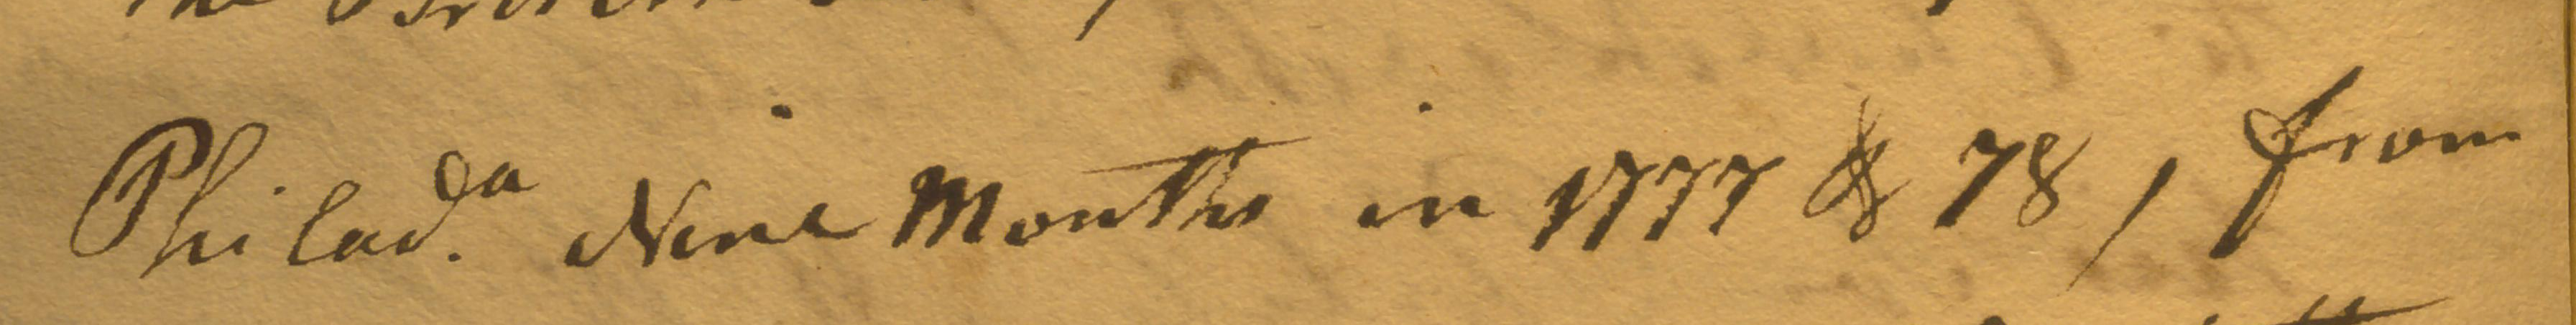Philad^a. Nine Months in 1777 & 78, from
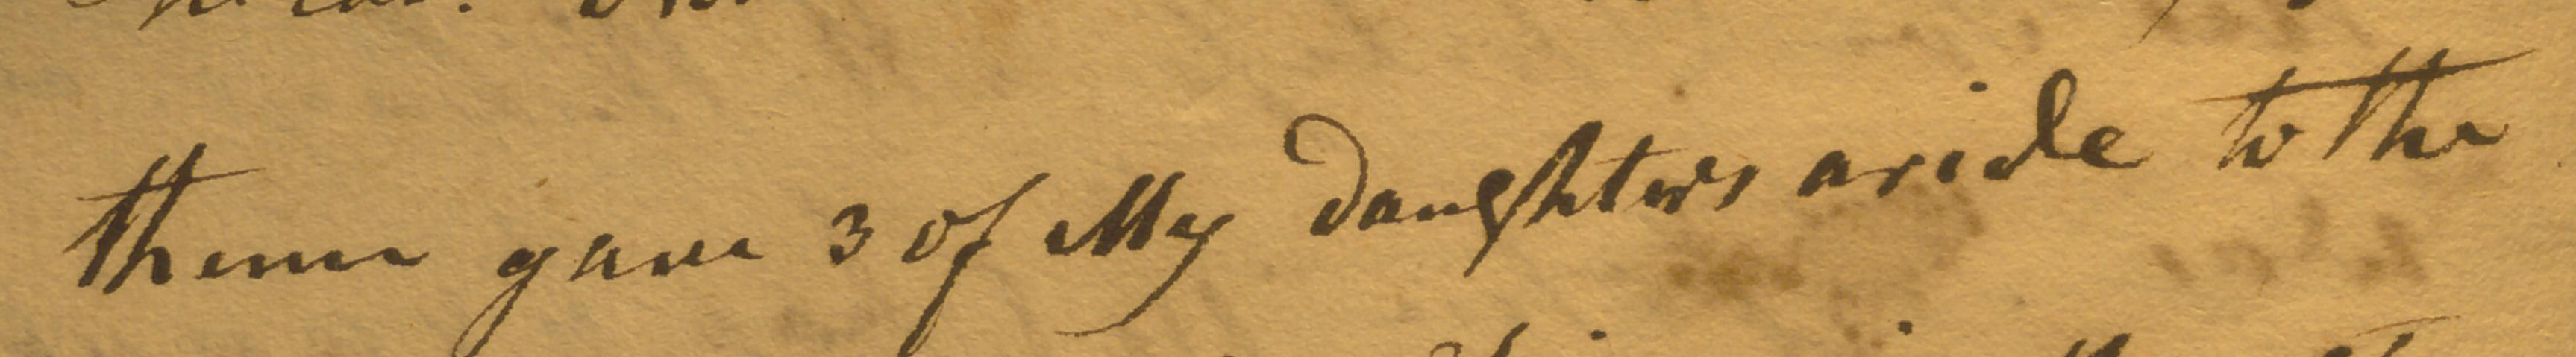thence gave 3 of My daughters a ride to the
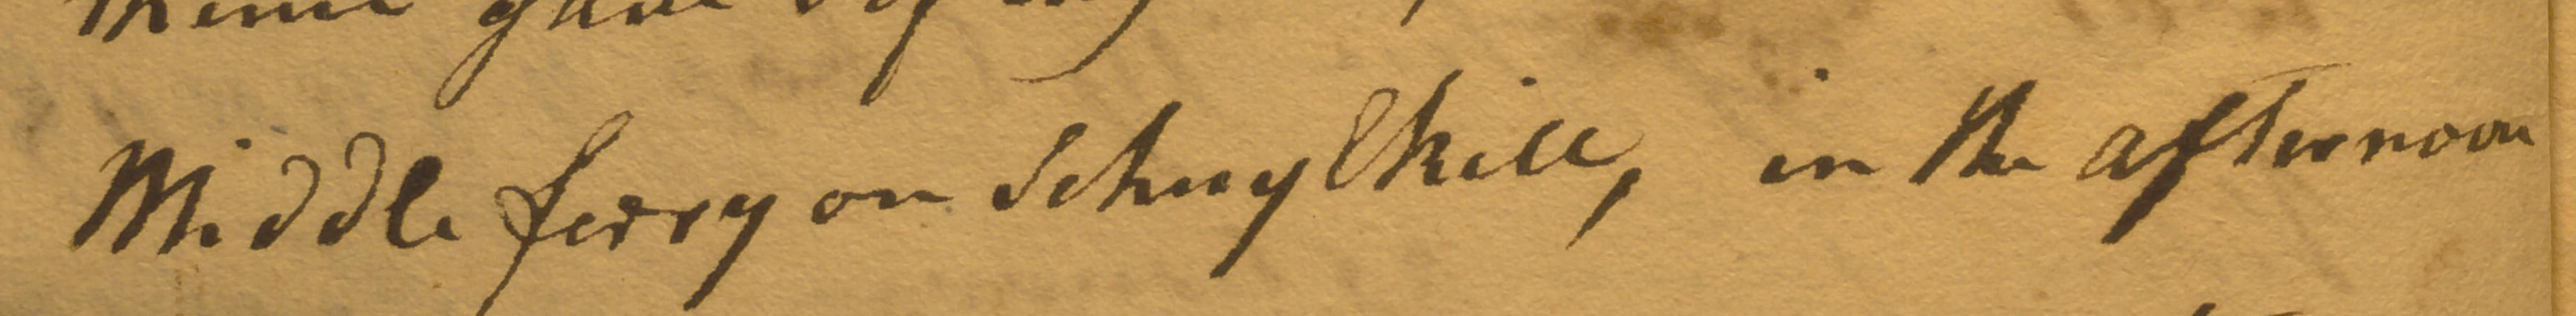Middle ferry on Schuylkill, in the afternoon
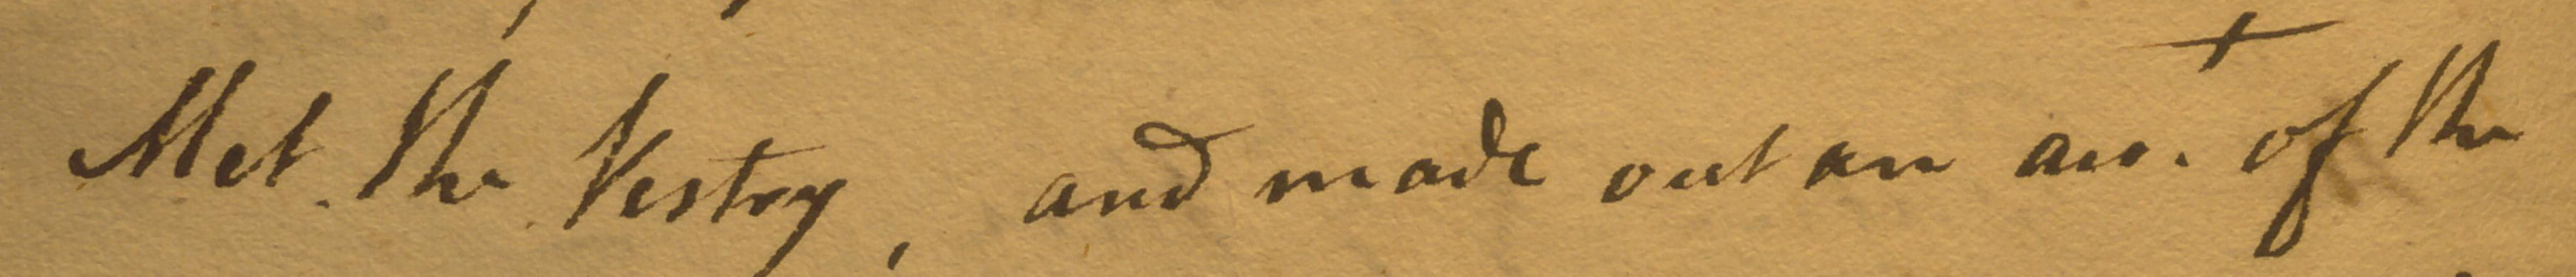Met the Vestry and made out an acc^t. of the
